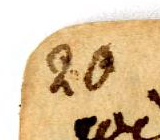20
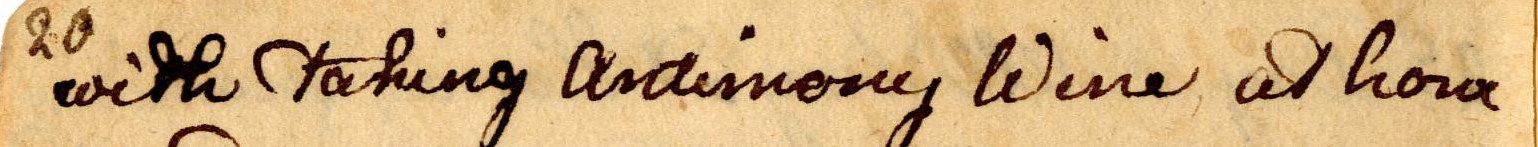with taking Ardimony Wine at hora
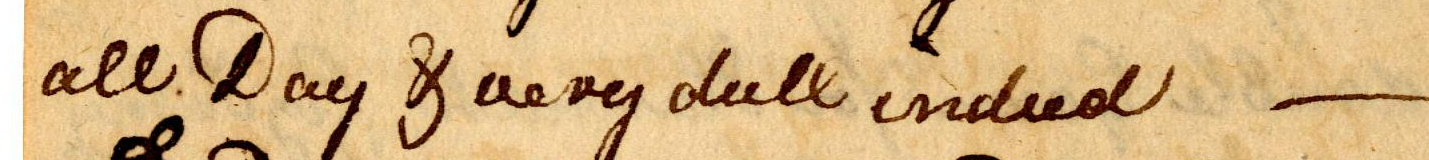all Day & very dull indeed-
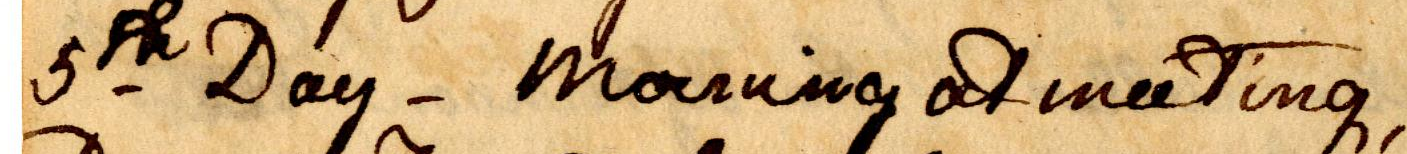5^th Day- Morning at meeting,
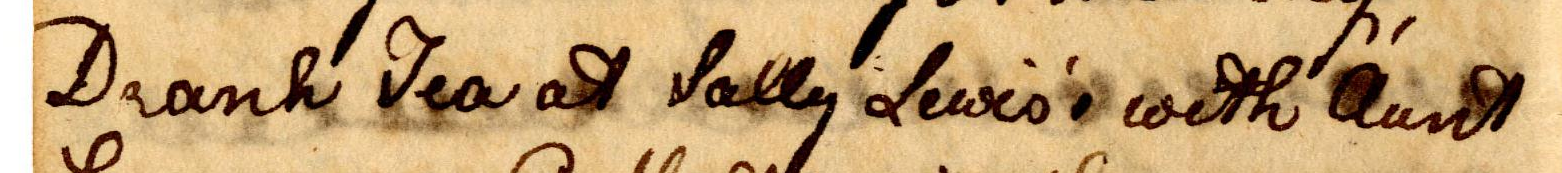Dranks Tea at Sally Lewis's with Aunt
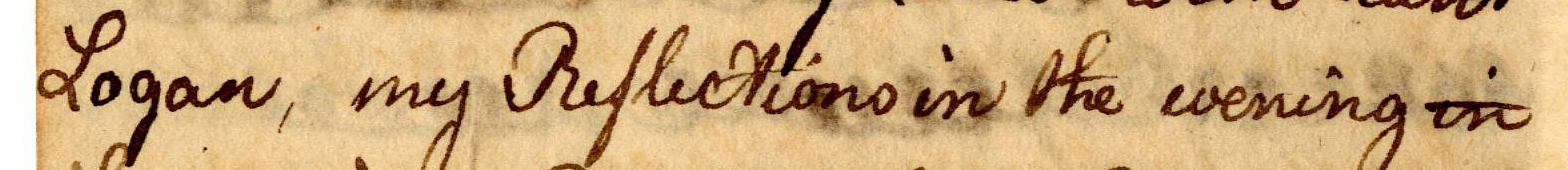Logan, my Reflections in the evening in
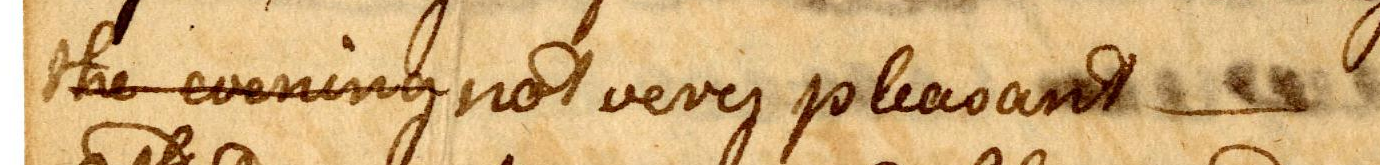the evening not very pleasant-
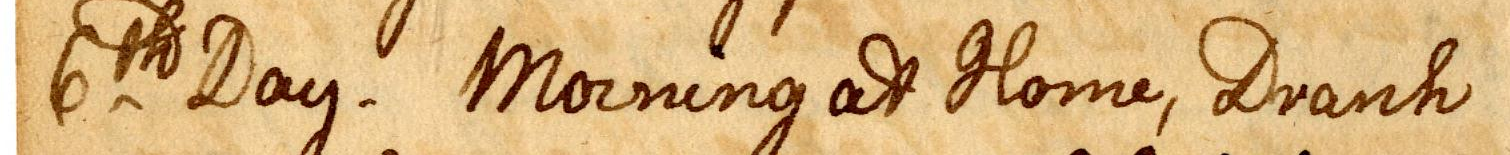6^th Day- Morning at Home, Drank
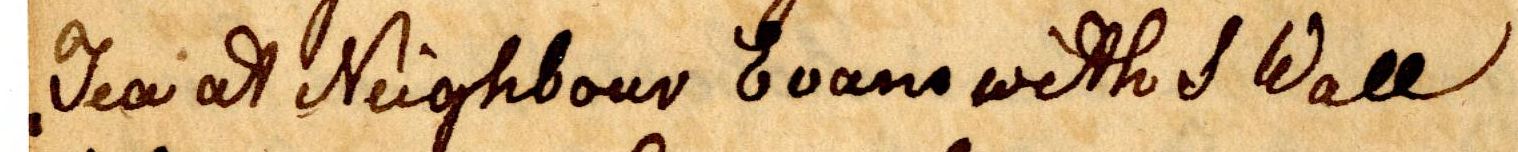Tea at Neighbour Evans with S Wall
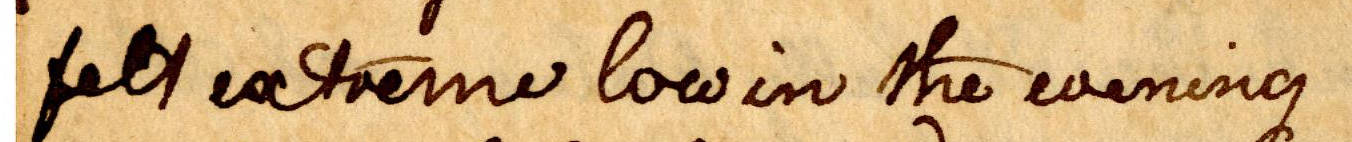felt extreme low in the evening
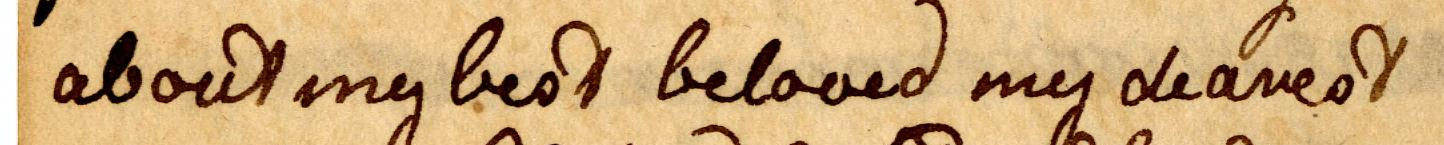about my best beloved my dearest
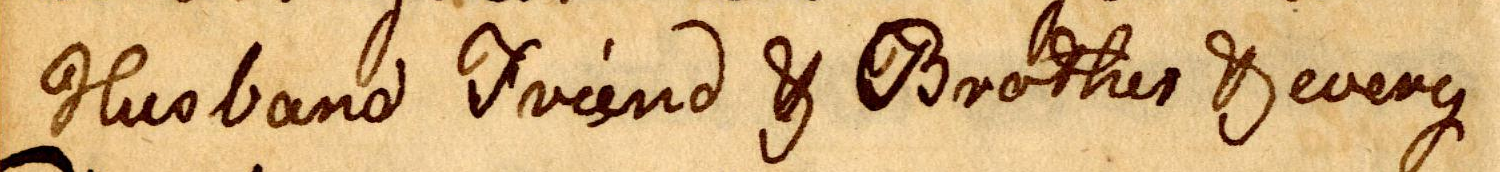Husband Friend & Brother & every
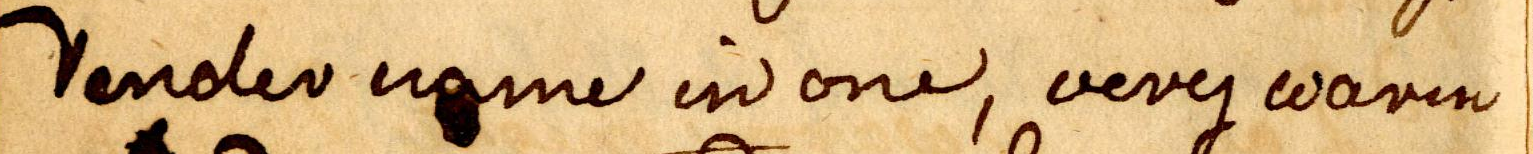tender name in one, very warm
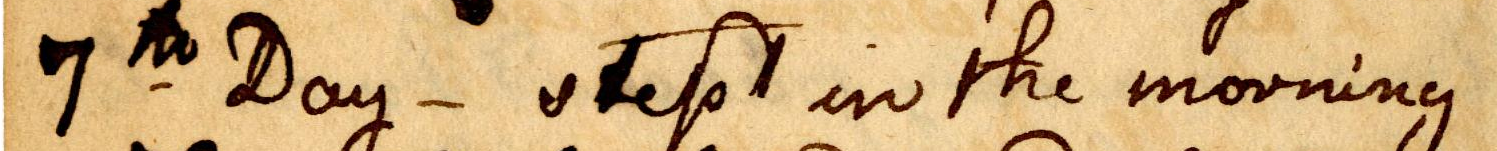7^th Day- stept in the morning
